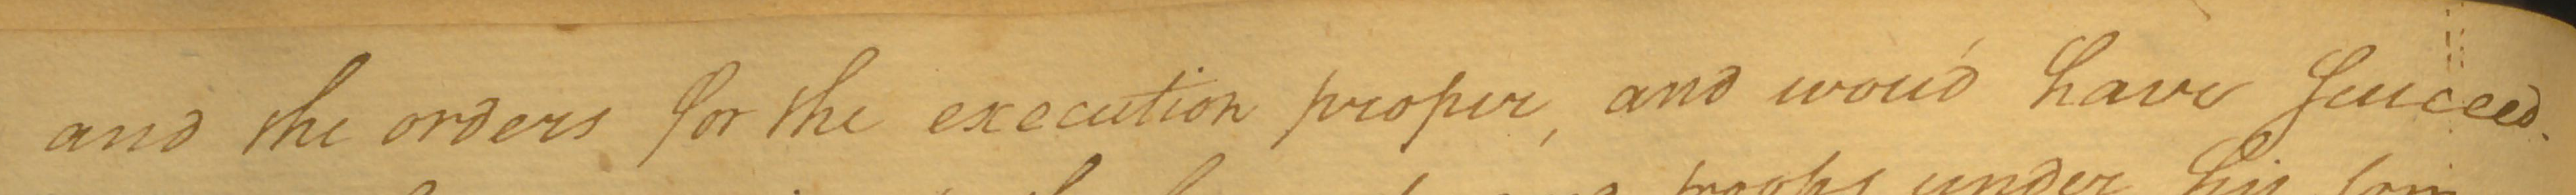and the orders for the execution proper, and wou'd have succeed
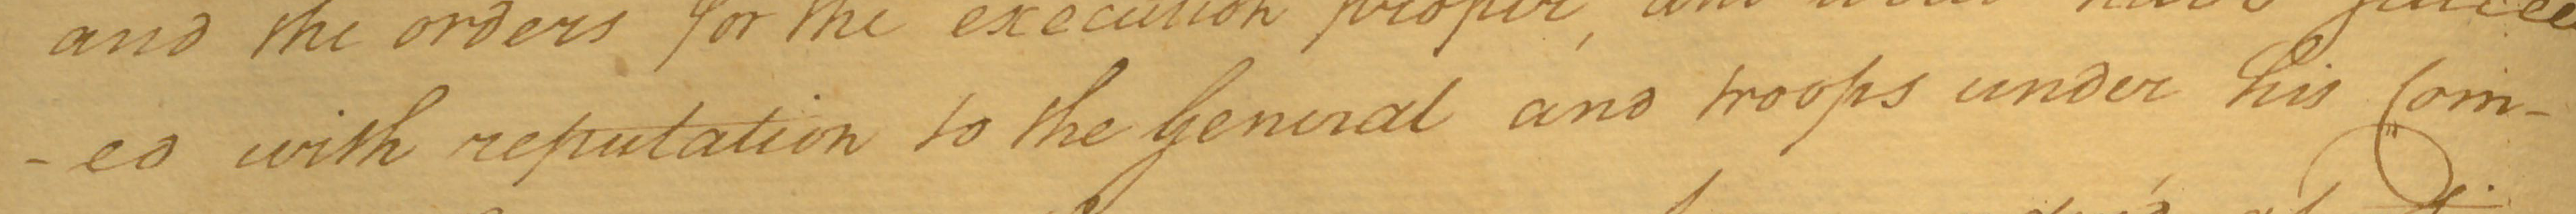-ed with reputation to the General and troops under his Com-
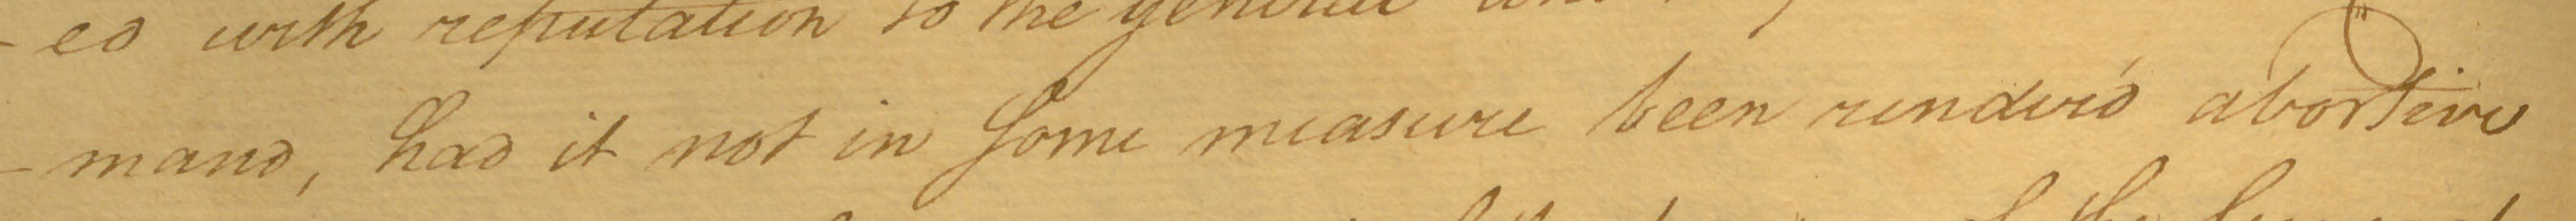-mand, had it not in some measure been render'd abortive
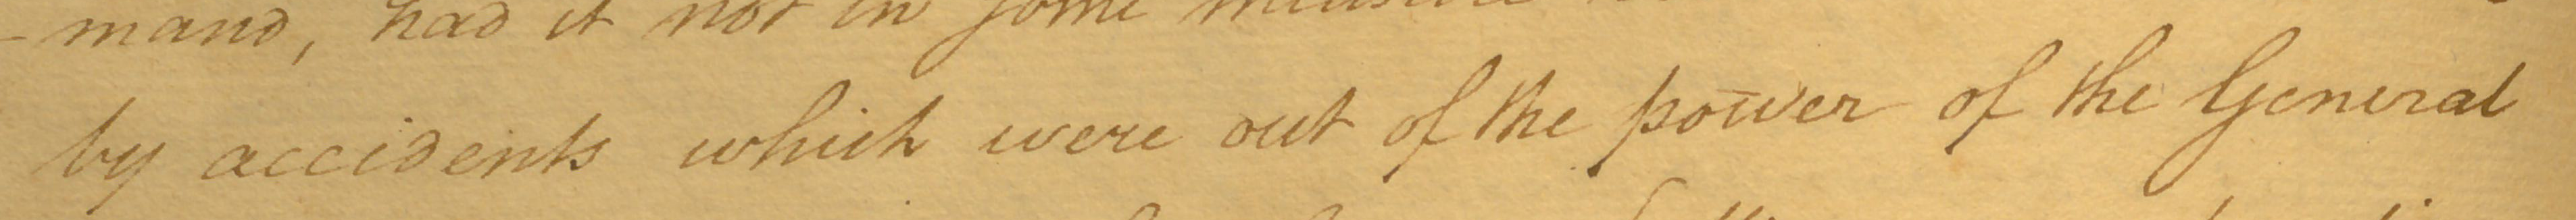by accidents which were out of the power of the General
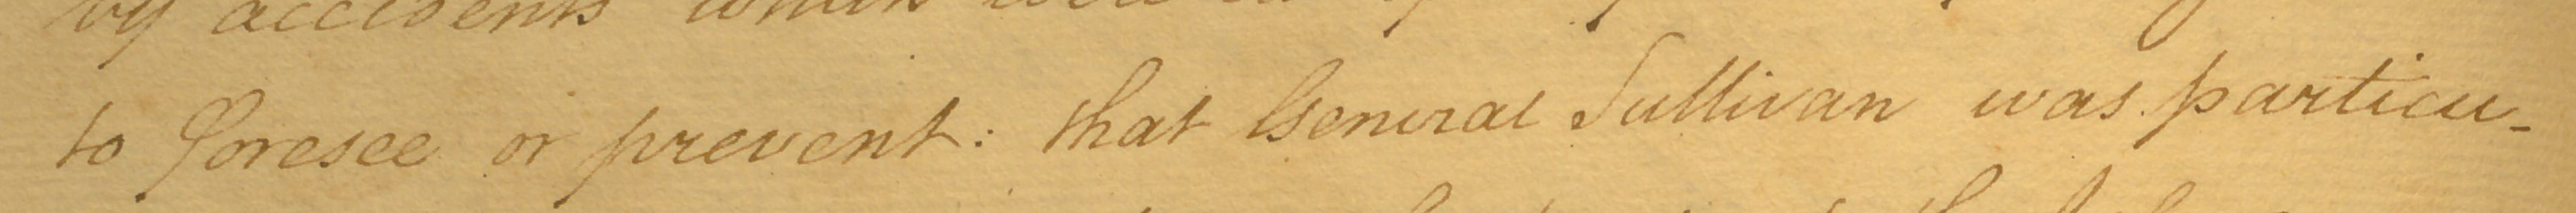to foresee or prevent: that General Sullivan was particu-
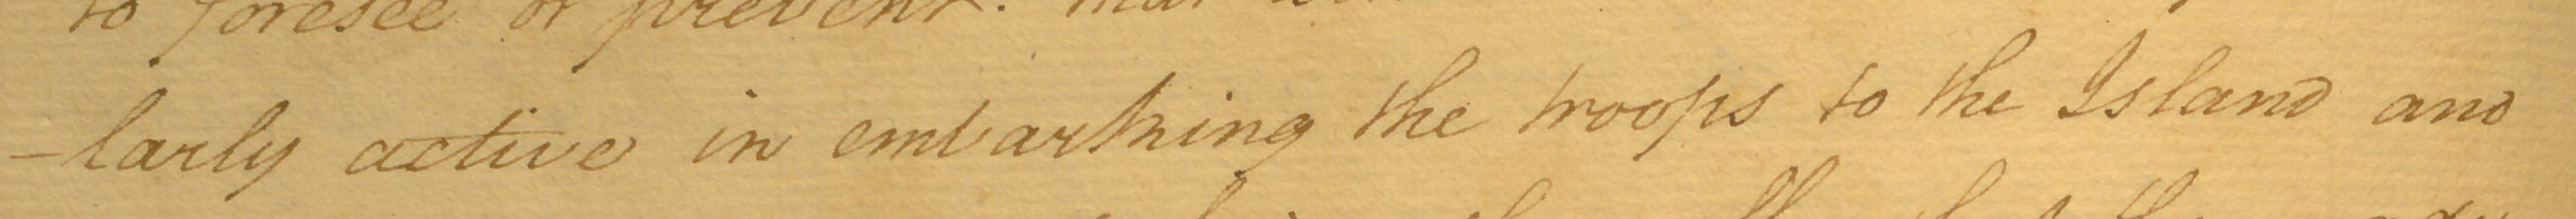-larly active in embarking the troops to the Island and
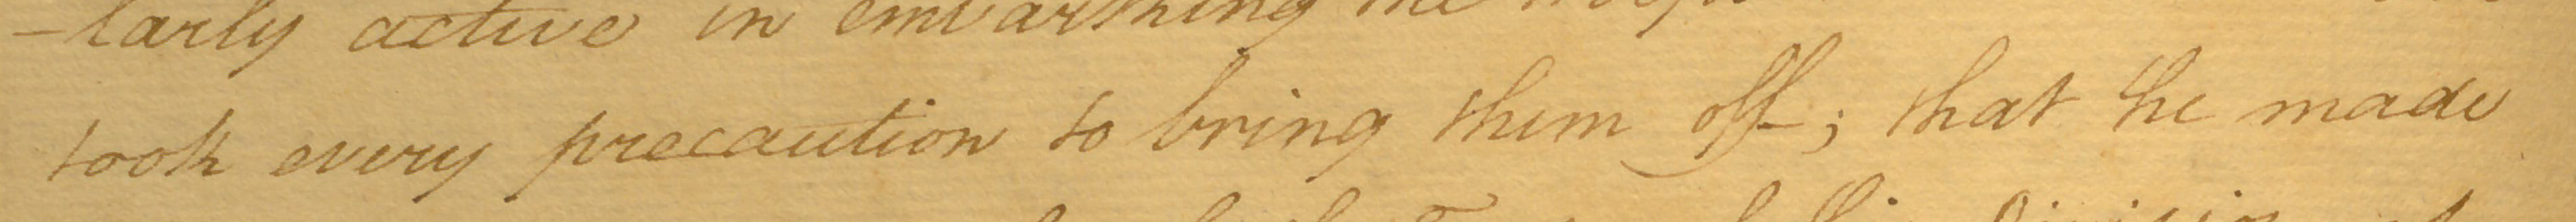took every precaution to bring them off; that he made
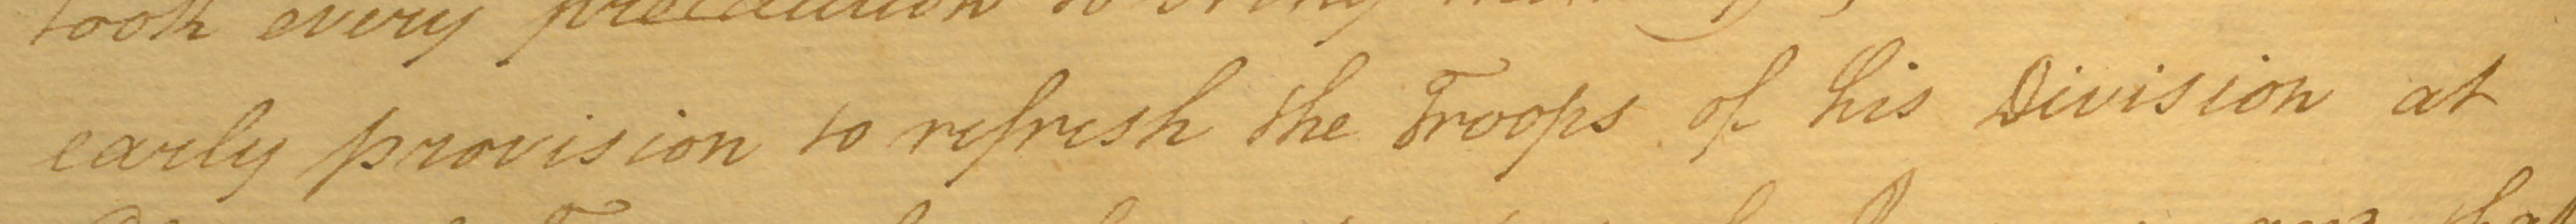early provision to refresh the Troops of his Division at
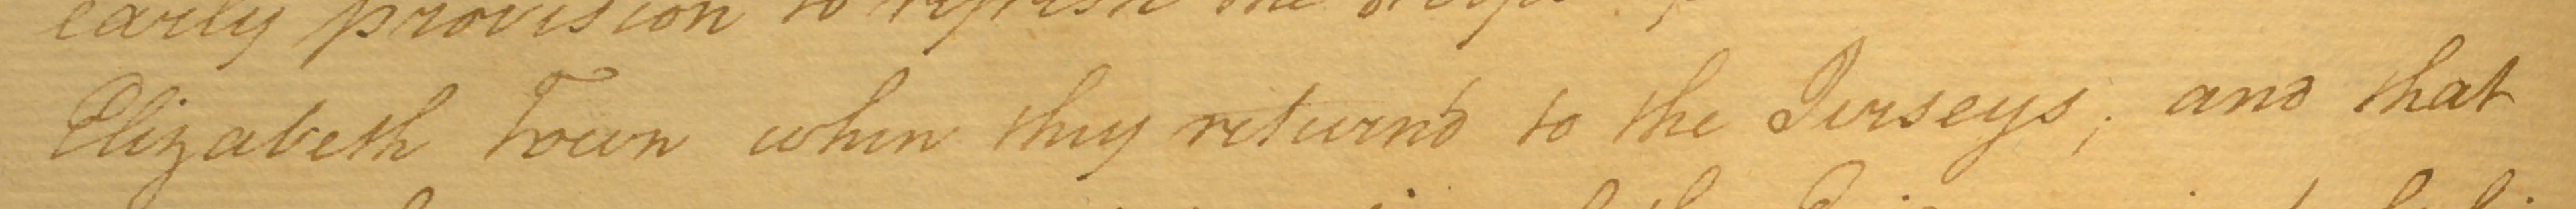Elizabeth Town when they return'd to the Jerseys; and that
